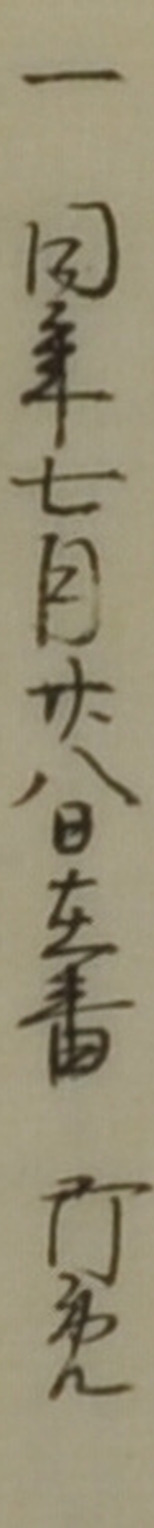一同年七月廿八日在番御免
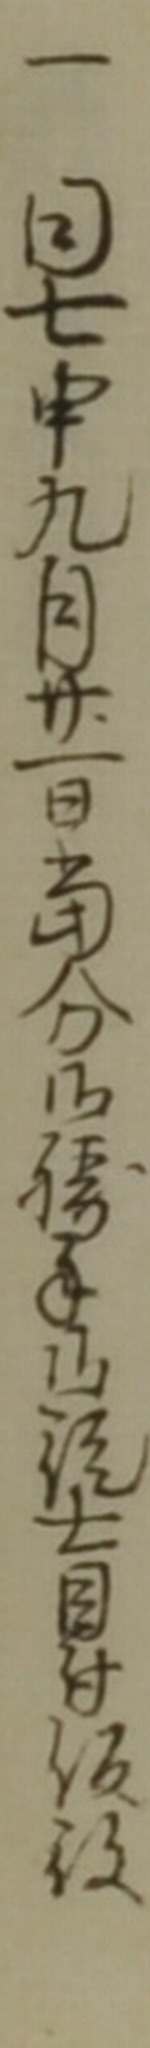一同七申九月廿一日当分御勝手御徒士目付仮役
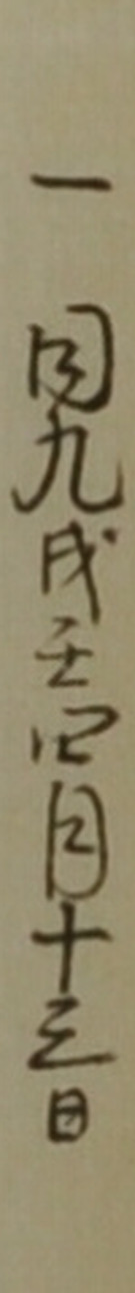一同九戌閏四月十三日
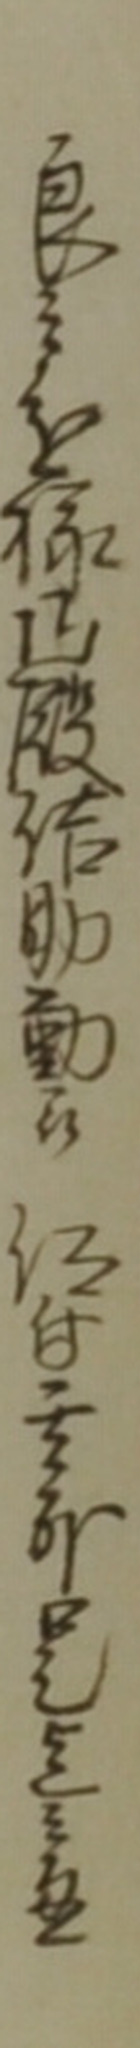良之進様御殿詰助勤被仰付其外是迄之通
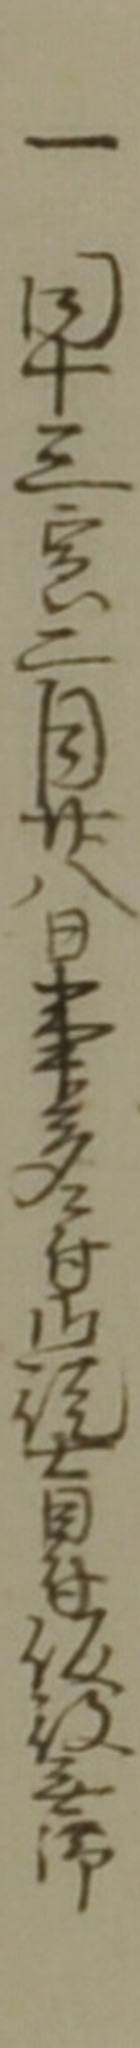一同十三寅二月廿八日事多ニ付御徒士目付仮役無滞
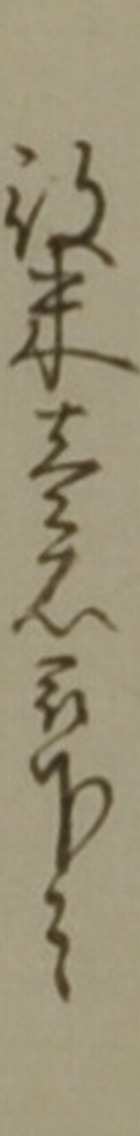役米壱石被下之
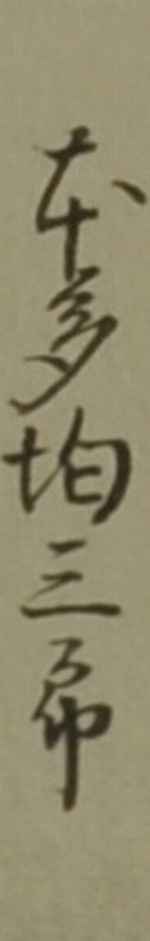本多均三郎
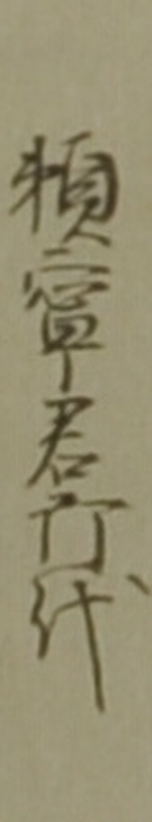頼寧君御代
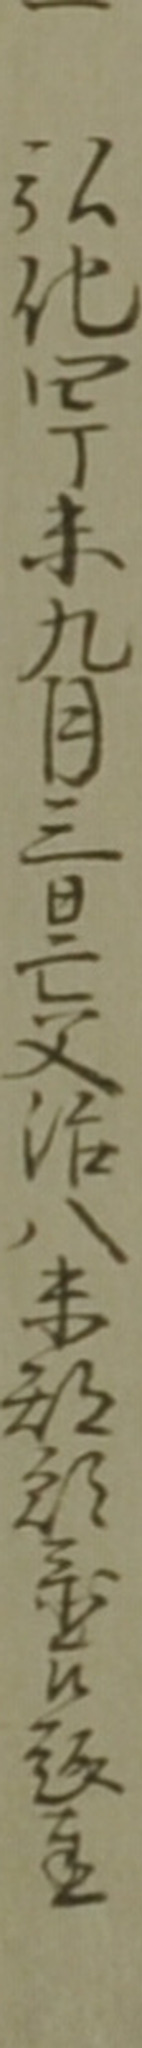一弘化四丁未九月三日亡父治八末期願置候趣達
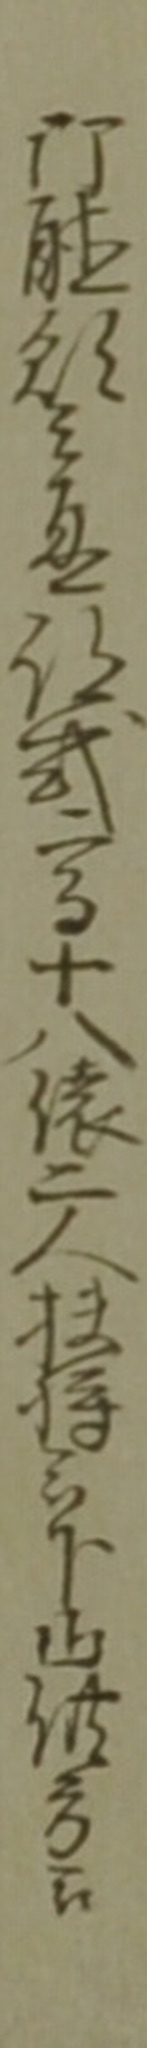御聴願之通跡式高十八俵二人扶持被下御供方被
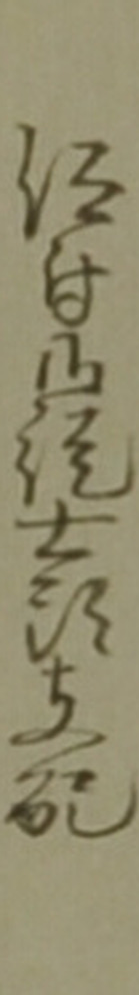仰付御徒士頭支配
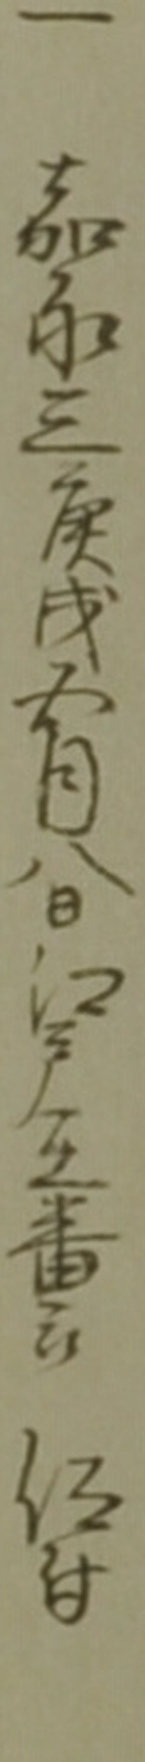一嘉永三庚戌五月八日江戸在番被仰付
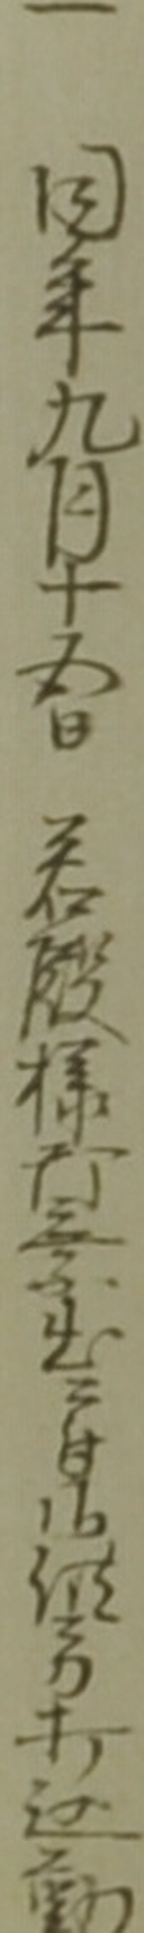一同年九月十五日若殿様御乗出ニ付御供方打込勤

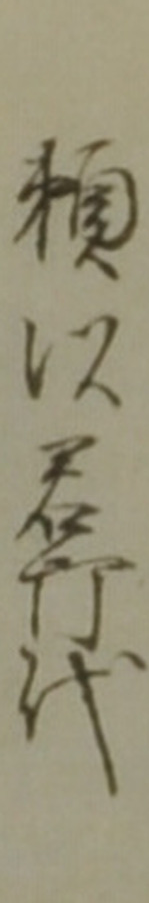頼以君御代
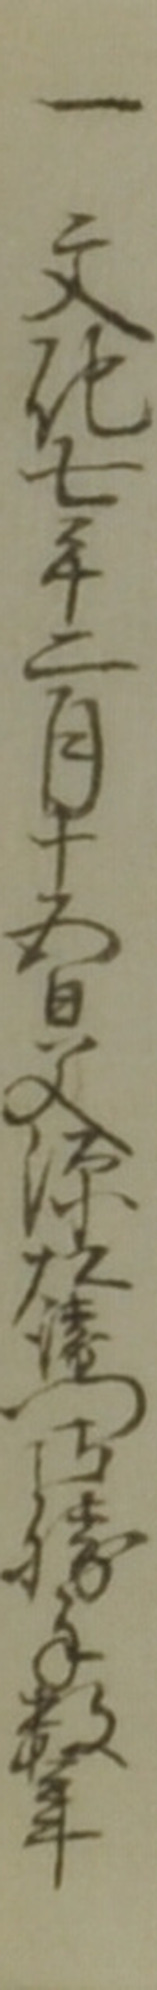一文化七午二月十五日父源左衛門御勝手数年
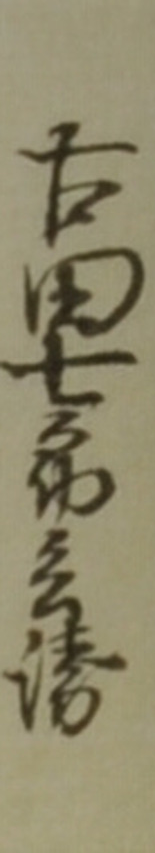古田七郎兵衛
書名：無足諸士勤仕録（六）
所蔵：伊那市立高遠町図書館・合同会社AMANE
